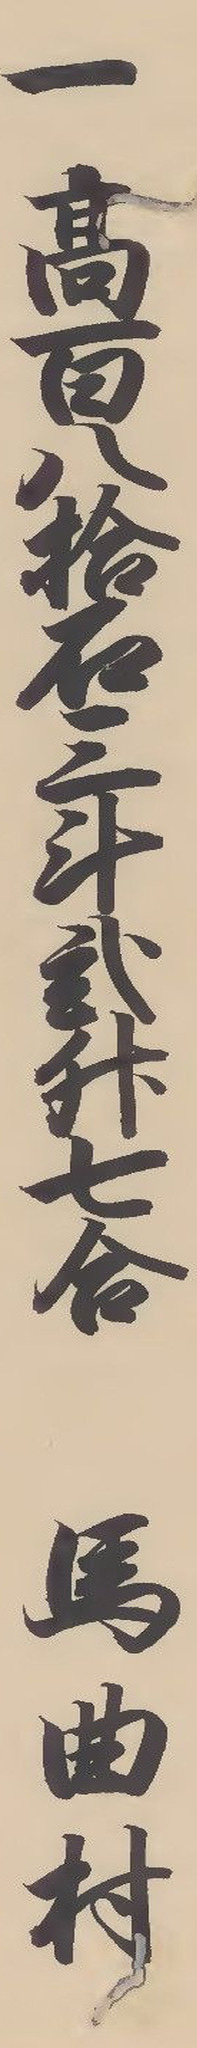一高百八拾石三斗弐升七合馬曲村
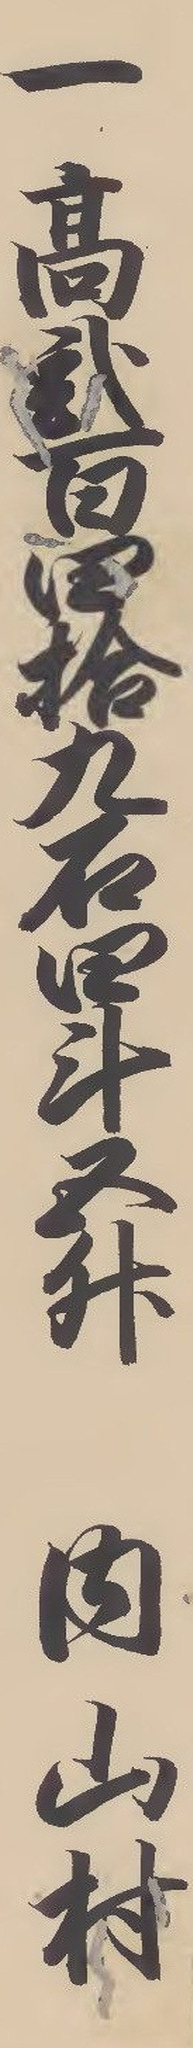一高弐百四拾九石四斗五升内山村
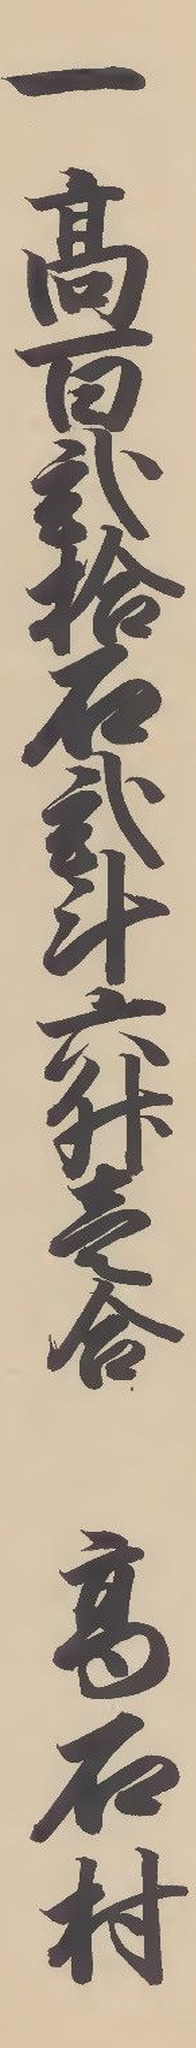一高百弐拾石弐斗六升壱合高石村
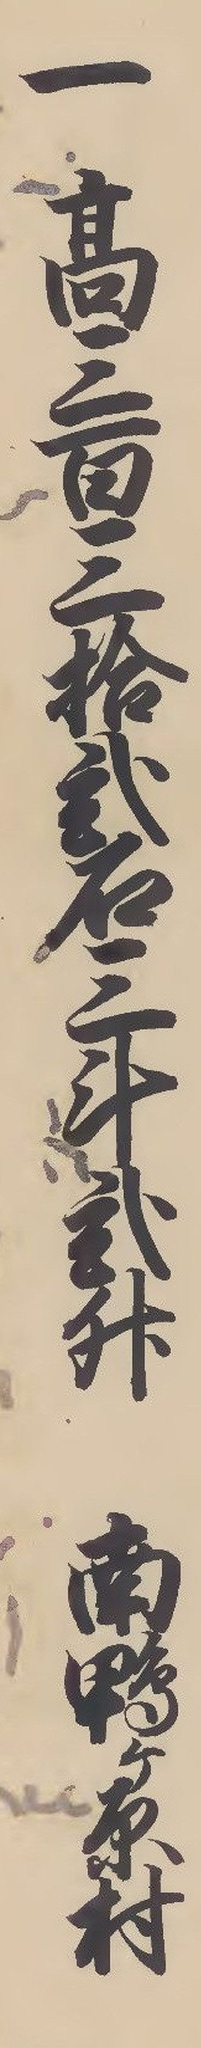一高三百三拾弐石三斗弐升南鴨ヶ原村

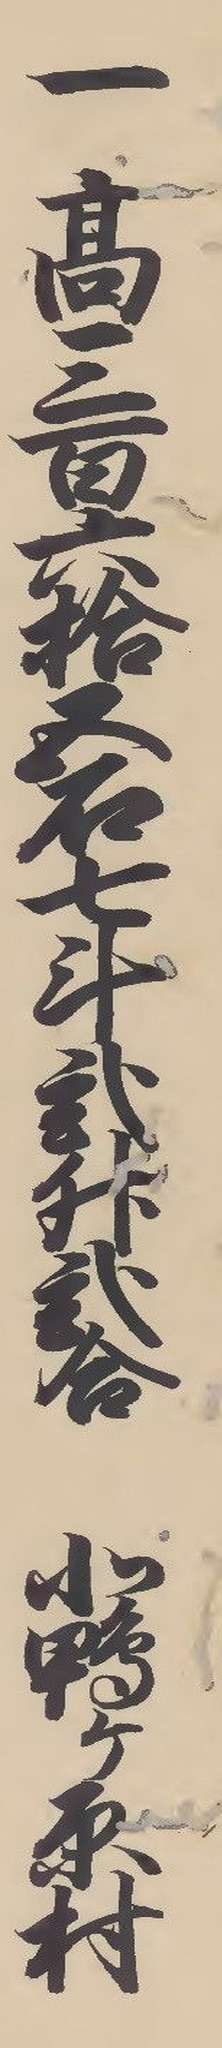一高三百六拾五石七斗弐升弐合北鴨ヶ原村
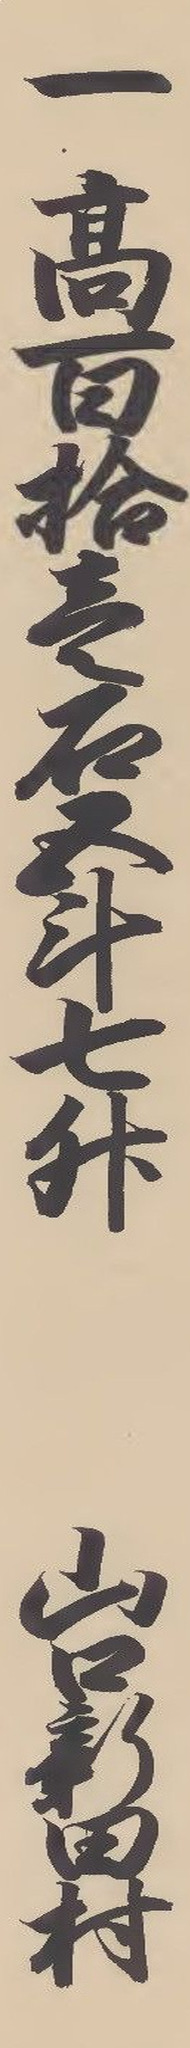一高百拾壱石五斗七升山口新田村
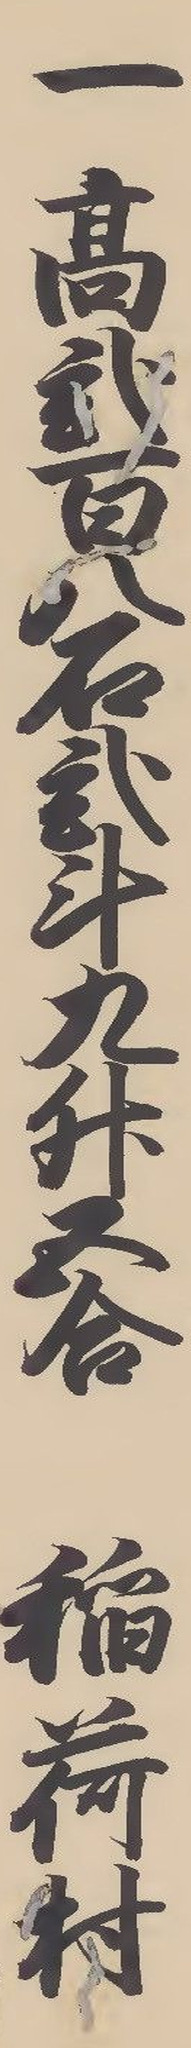一高弐百八石弐斗九升五合稲荷村
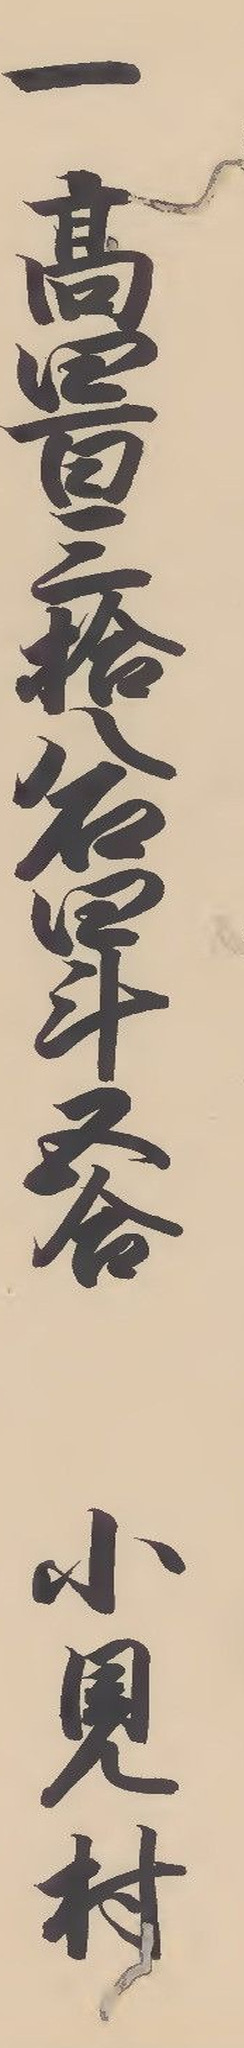一高四百三拾八石四斗五合小見村
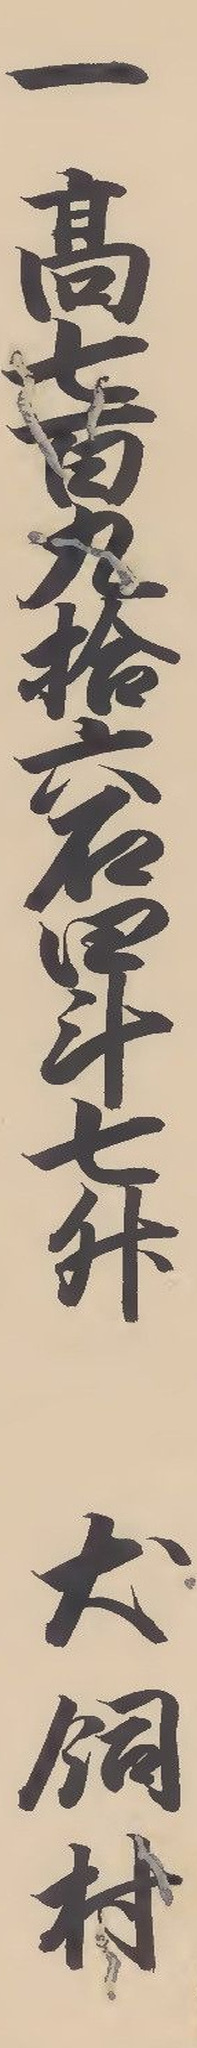一高七百九拾六石四斗七升犬飼村
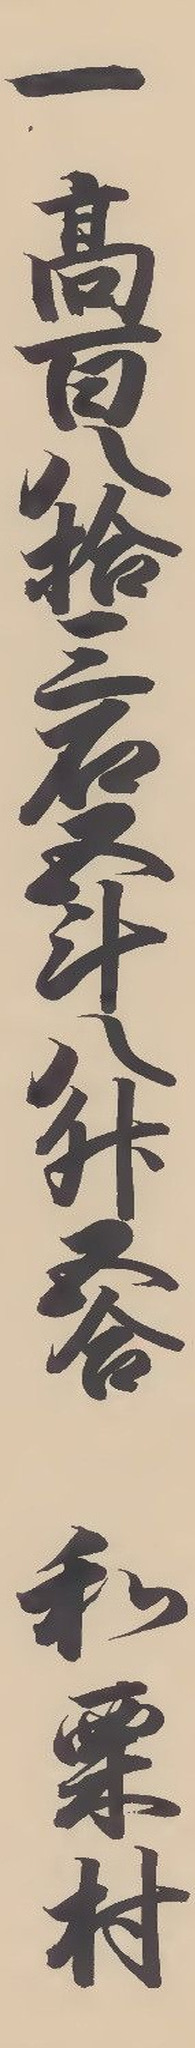一高百八拾三石五斗八升五合和栗村
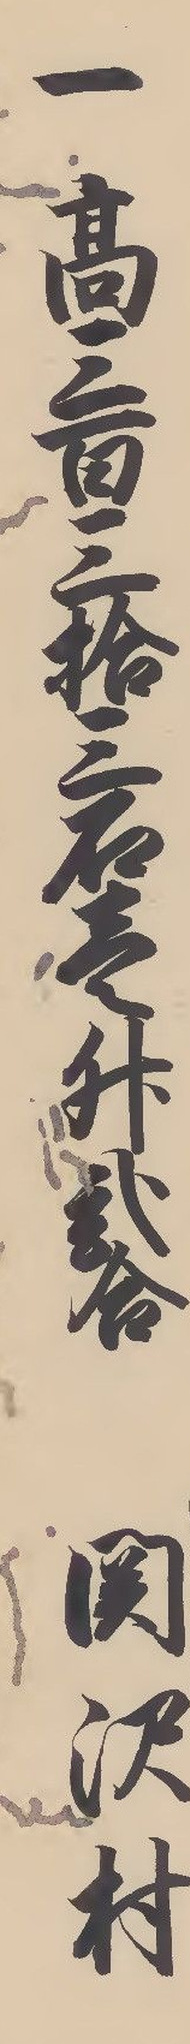一高三百三拾三石壱升弐合関沢村

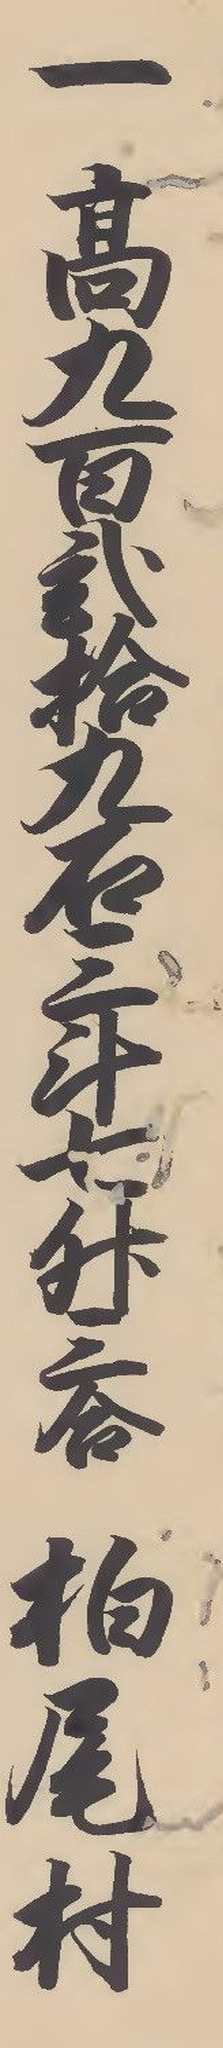一高九百弐拾九石三斗七升三合柏尾村
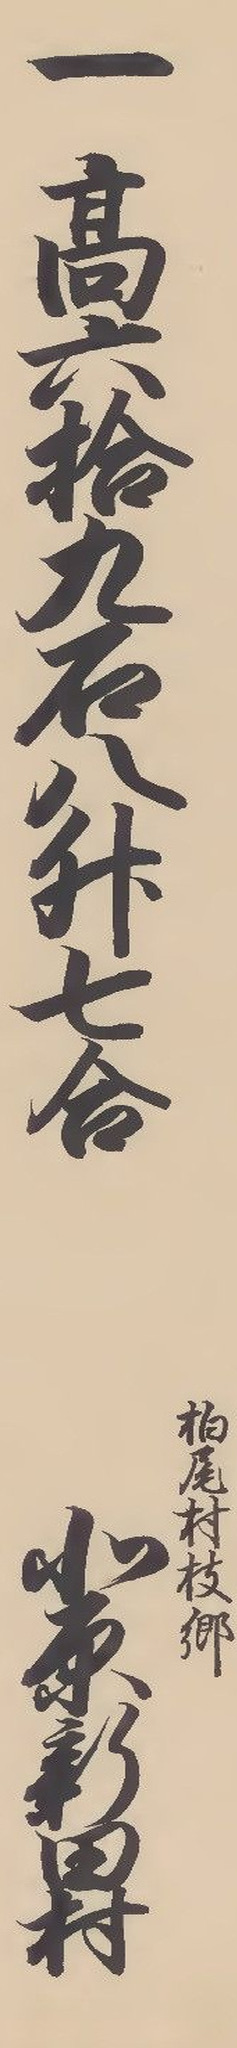一高六拾九石八升七合北原新田村
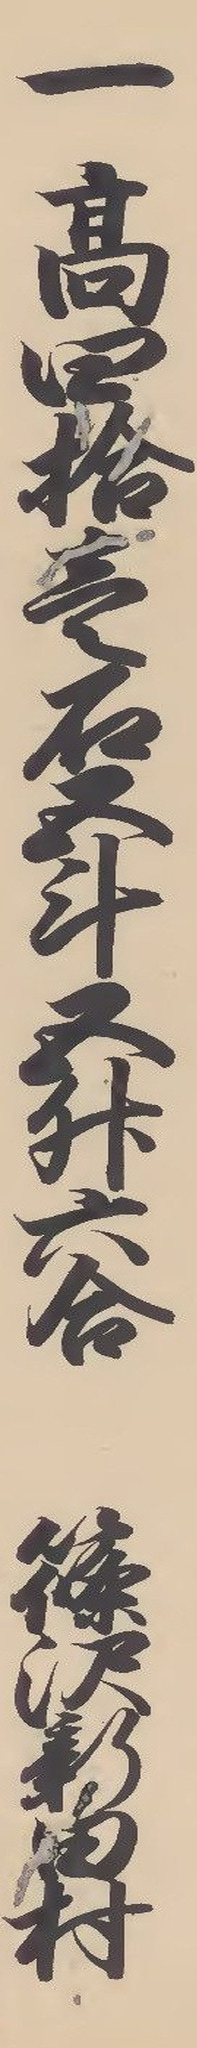一高四拾壱石五斗五升六合篠沢新田村
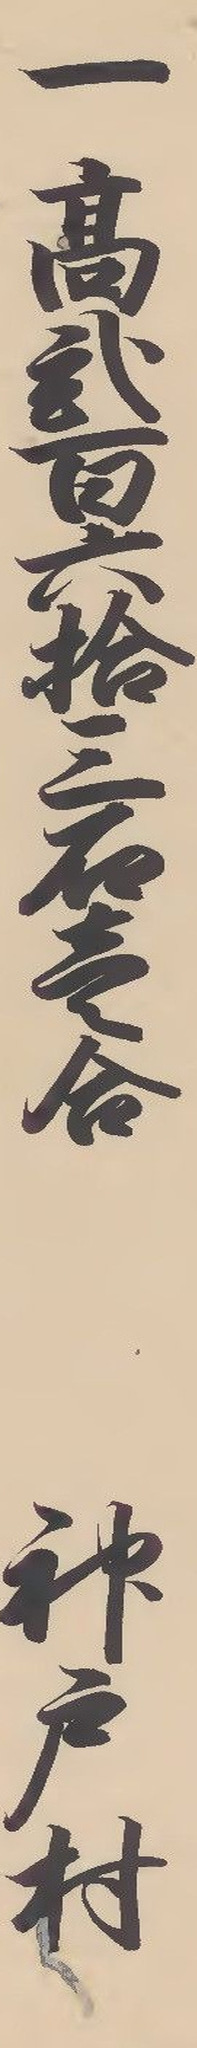一高弐百六拾三石壱合神戸村
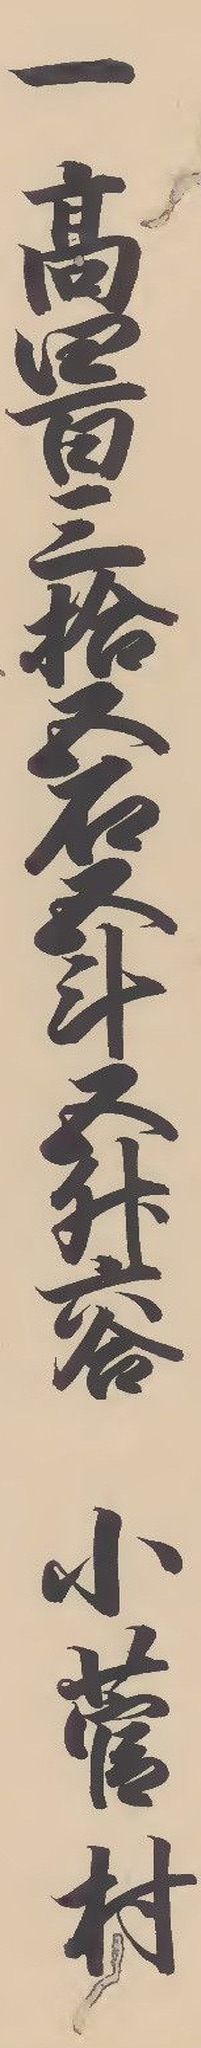一高四百三拾五石五斗五升六合小菅村
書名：信濃国郷帳
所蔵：国立公文書館 National Archives of Japan
